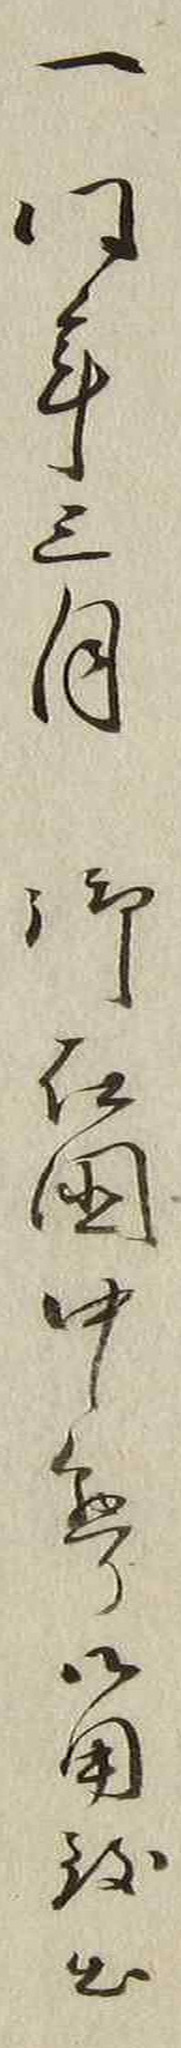一同年三月御在国中懸り御用致出
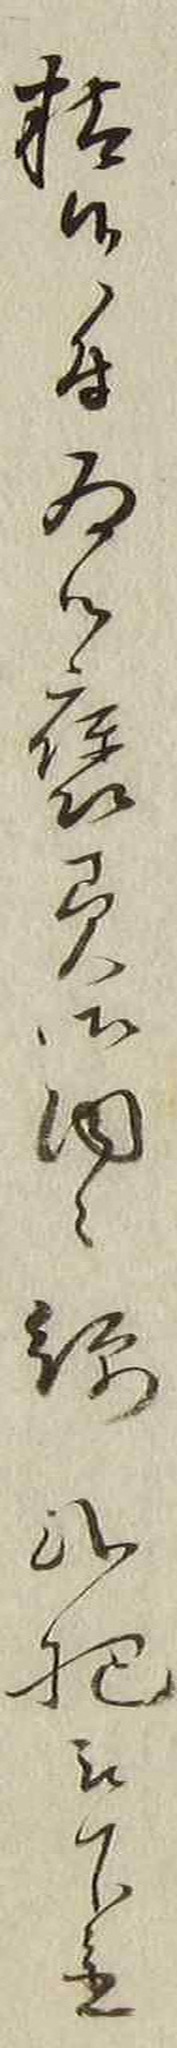精候ニ付為御褒美御内々綿弐把被下置
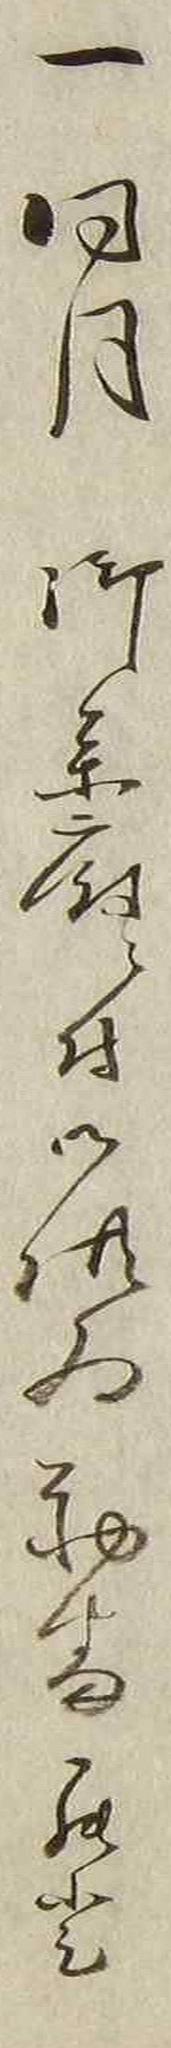一同月御参府ニ付御供為勤番罷登
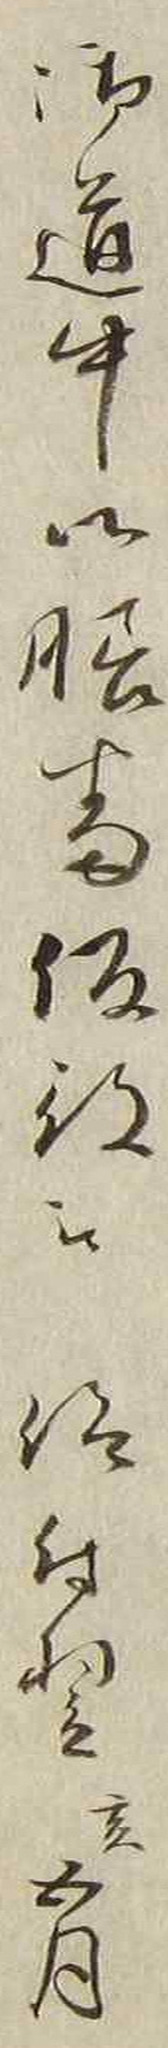御道中御膳番仮役被仰付翌亥五月
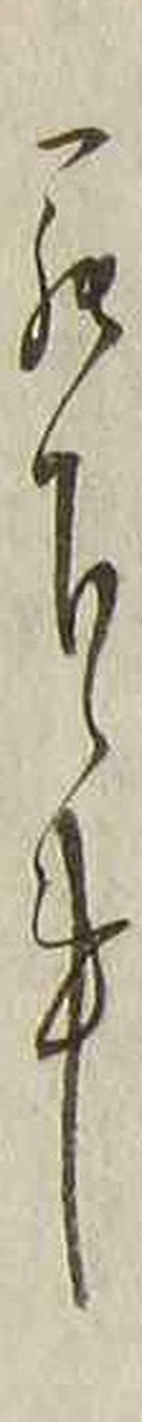罷下候事

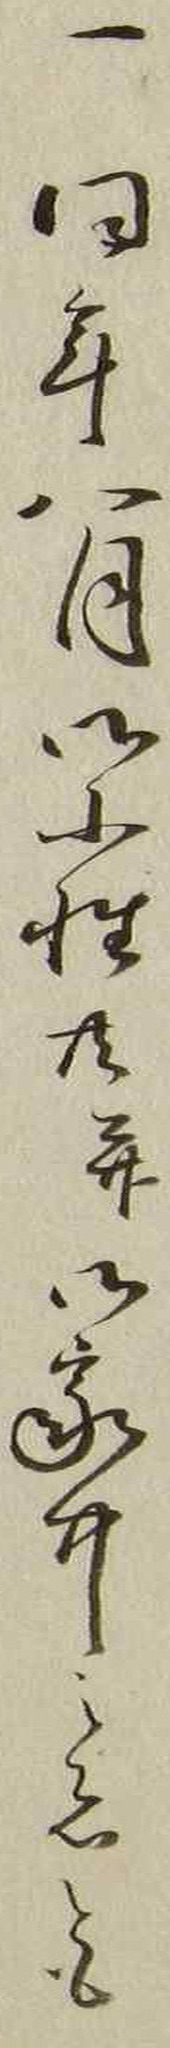一同年八月御小性共并御家中之者とも
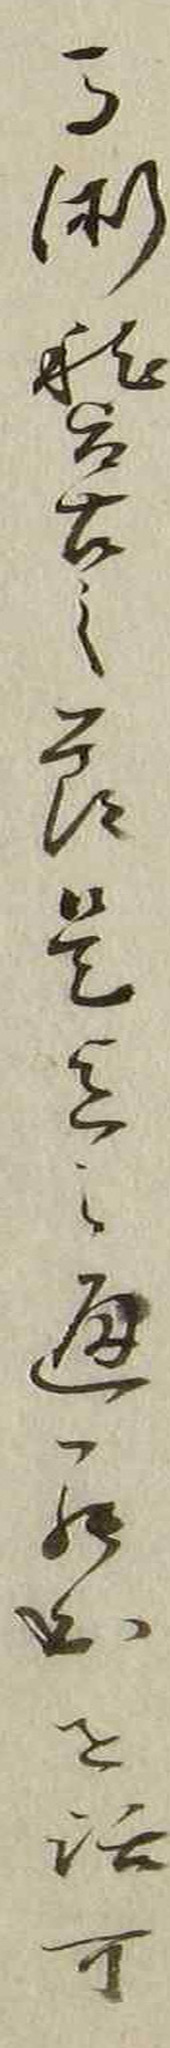馬術稽古之節是迄之通罷出世話可
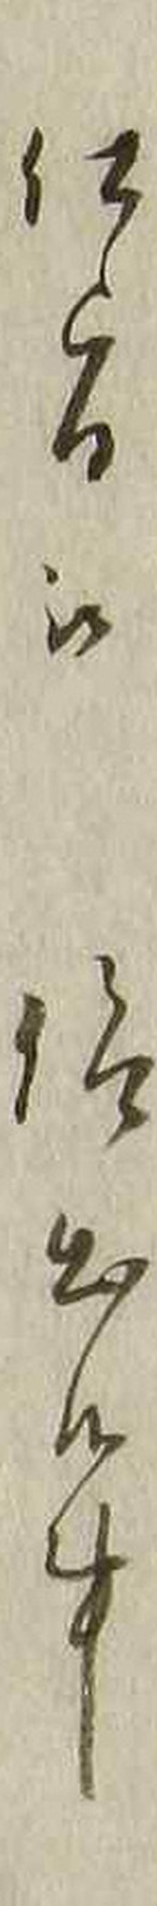仕旨被仰出候事
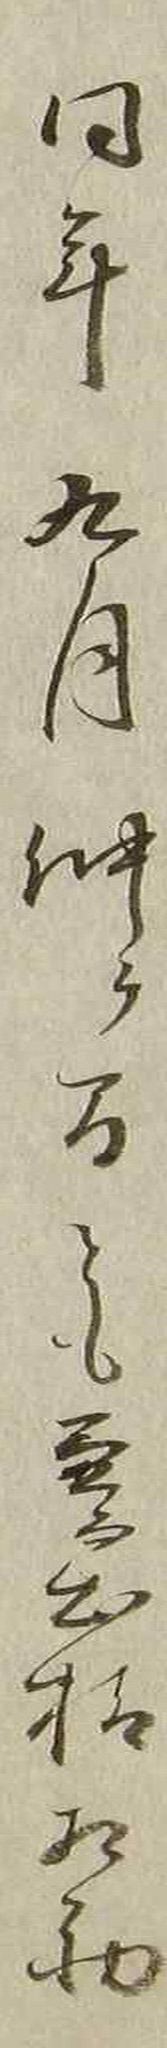一同年九月仲ケ間とも兼而出精相勤
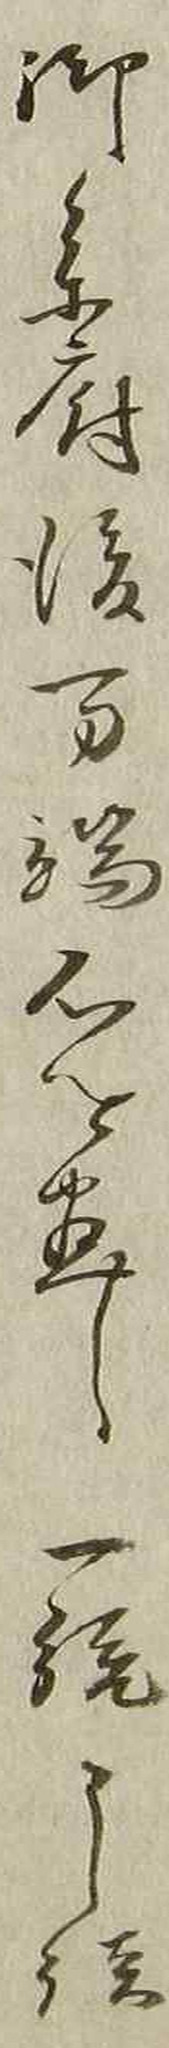御参府後万端心を尽し一統申談
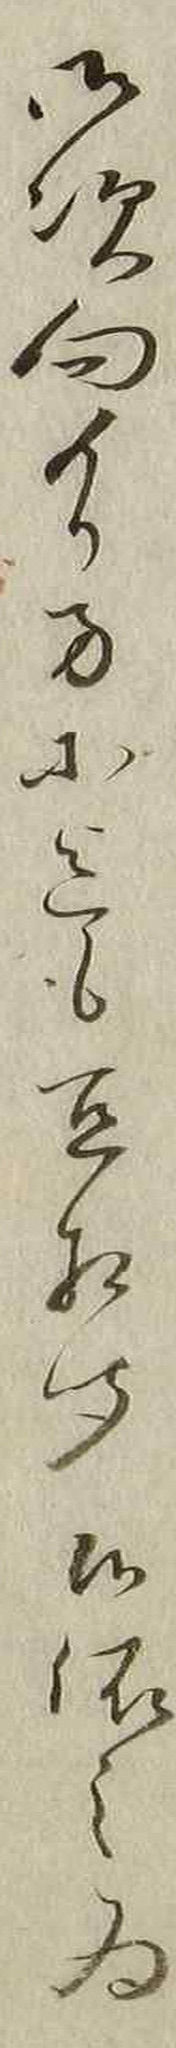御次向〆り方等迄も宜相聞候依之為
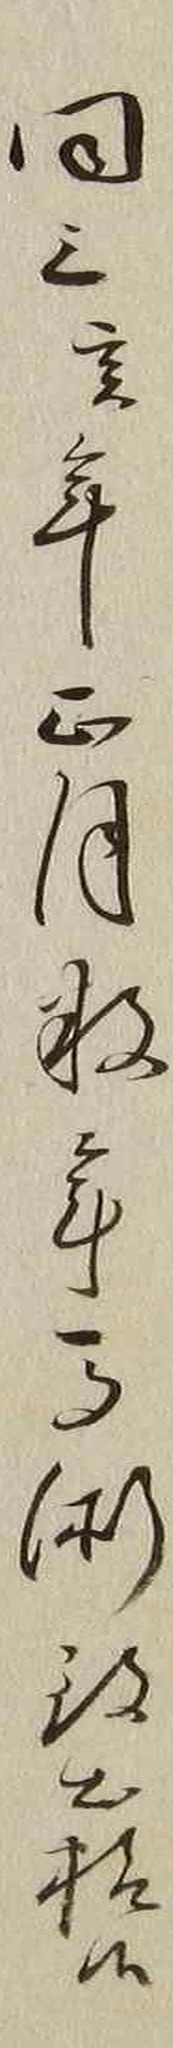一同三亥年正月数年馬術致出精候
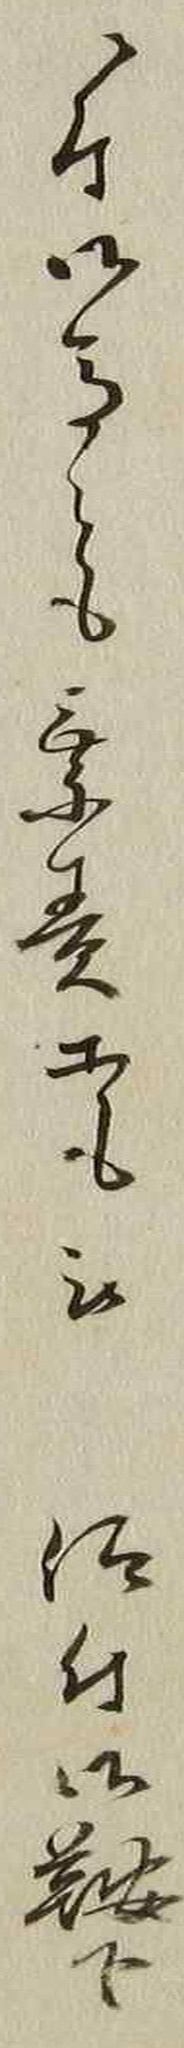ニ付御馬とも乗責等も被仰付御鞍下
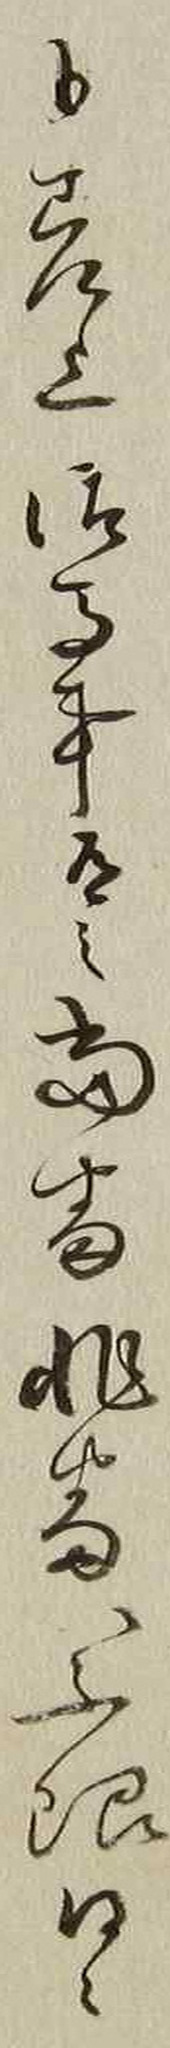も差上御馬事共之当番非番ニ不限日々
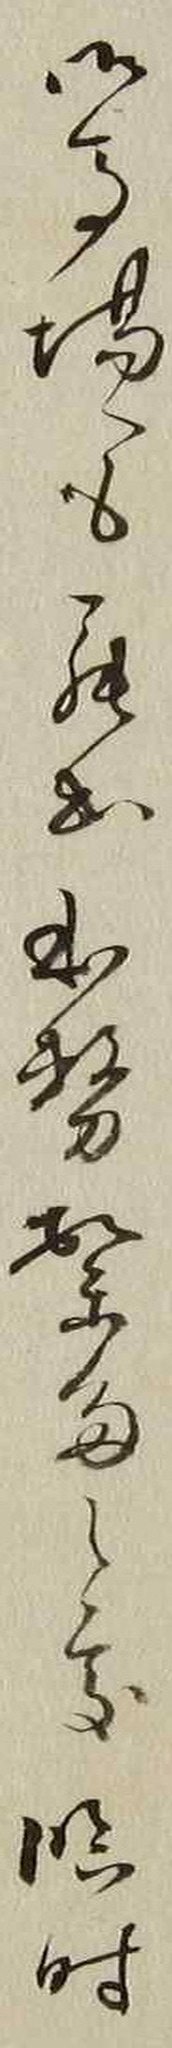御馬場へも罷出本務繁多之処臨時
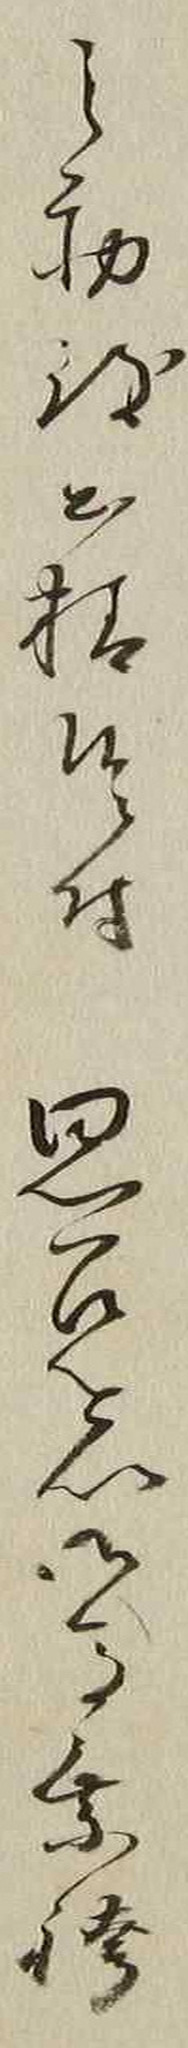之勤致出精候ニ付思召を以御馬乗袴
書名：諸士系譜　巻之25　い之部25
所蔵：会津若松市立会津図書館
